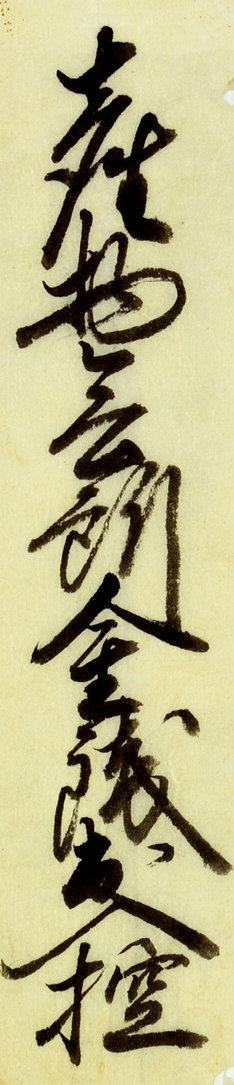産物会所金銭出入控
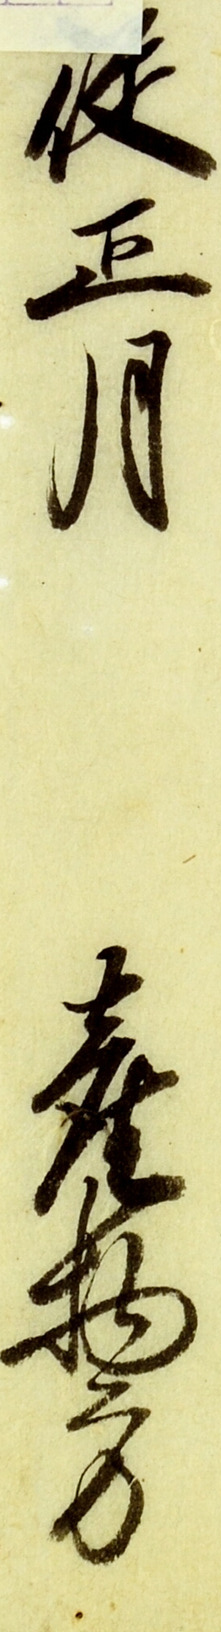従正月産物方
